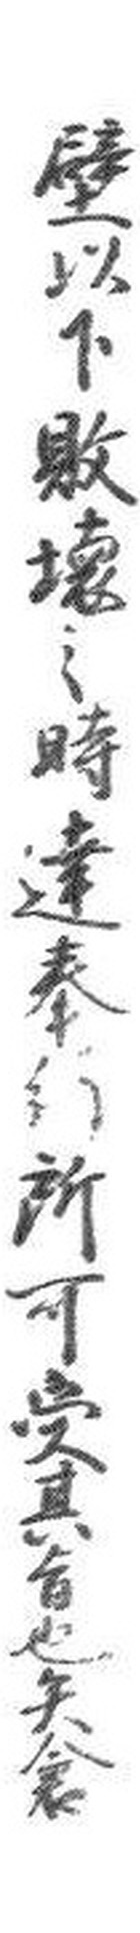壁以下敗壊之時達奉行所可受其旨也矢倉
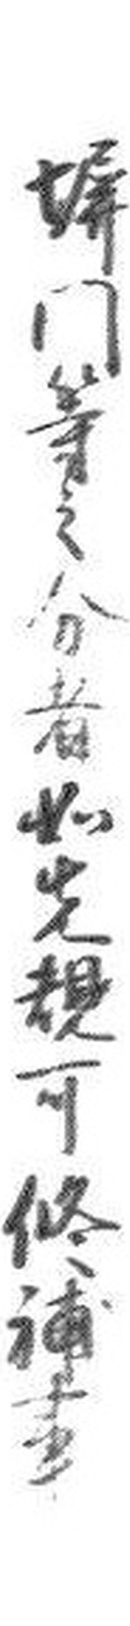塀門等之分者如先規可修補事
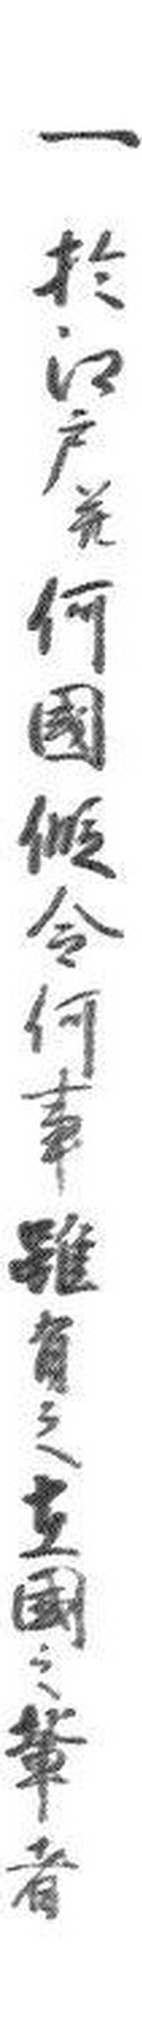一於江戸并何国仮令何事雖有之在国之輩者
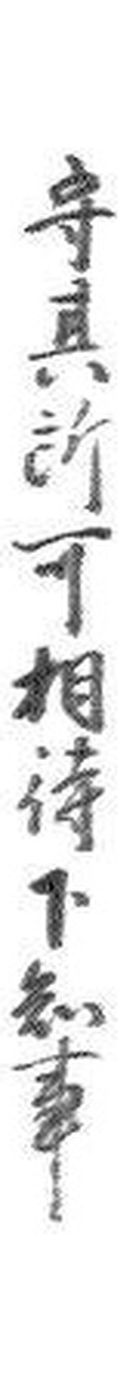守其所可相待下知事
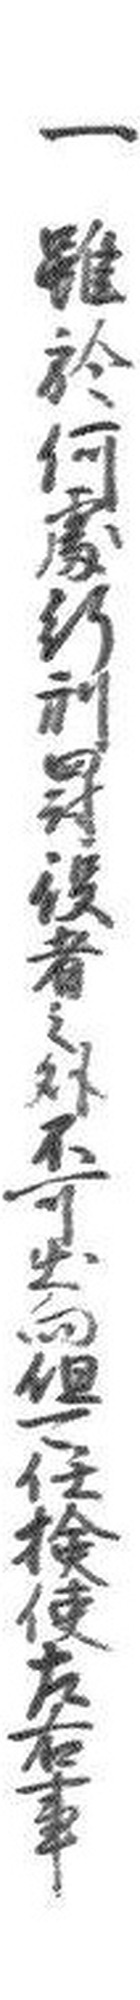一雖於何処行刑罰役者之外不可出向但可任検使左右事
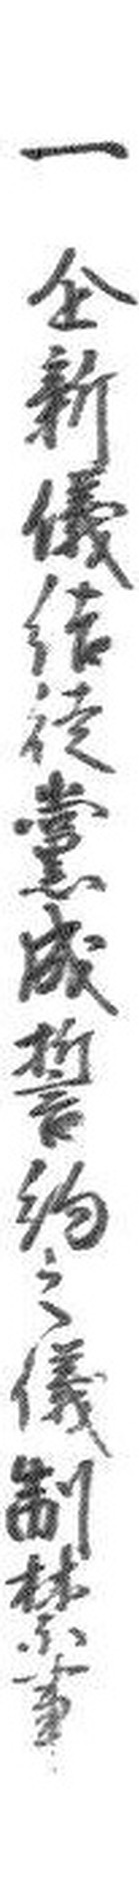一企新儀結徒党成誓約之儀制禁事
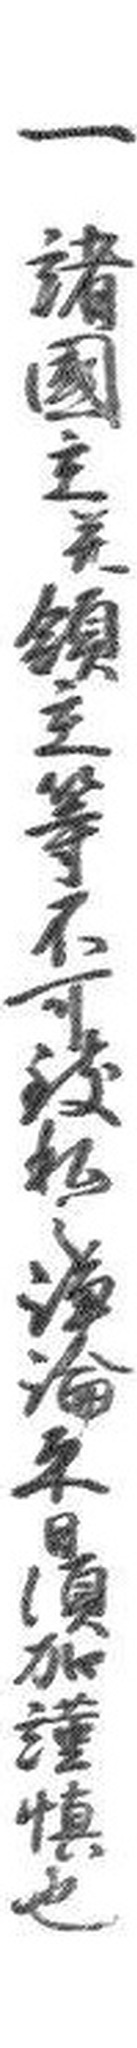一諸国主并領主等不可致私之諍論平日須加謹慎也
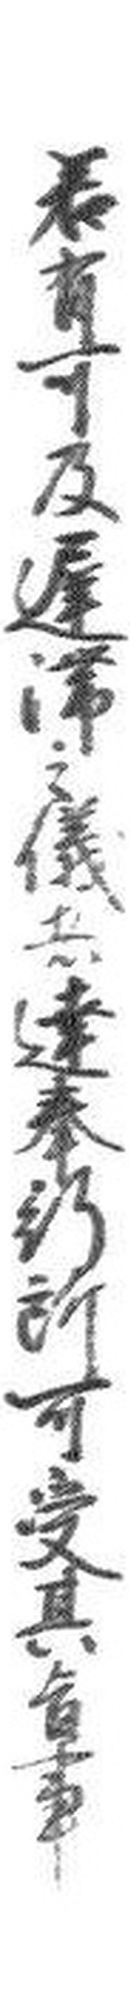若有可及遅滞之儀者達奉行所可受其旨事

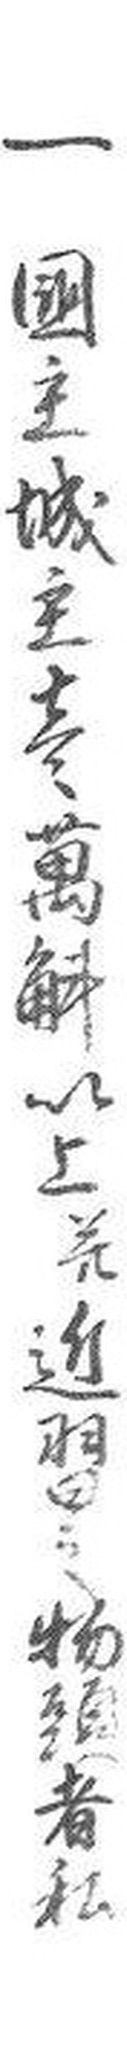一国主城主壱万斛以上并近習之物頭者私
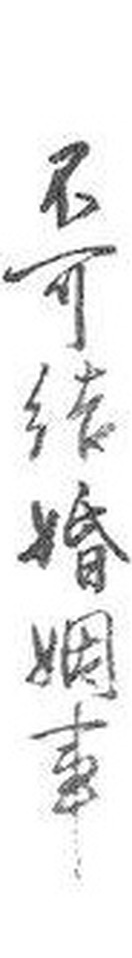不可結婚姻事
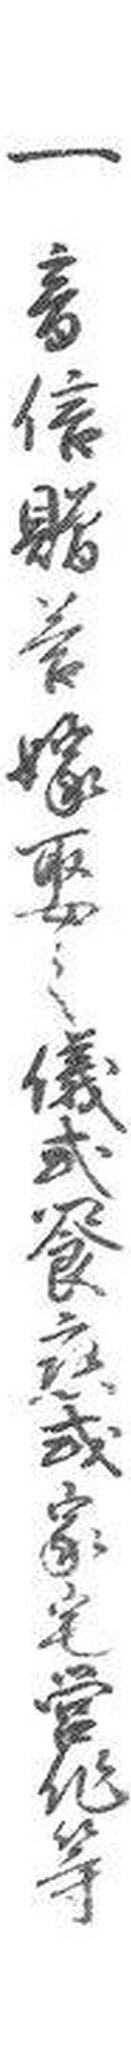一音信贈答嫁娶之儀或饗応或家宅営作等
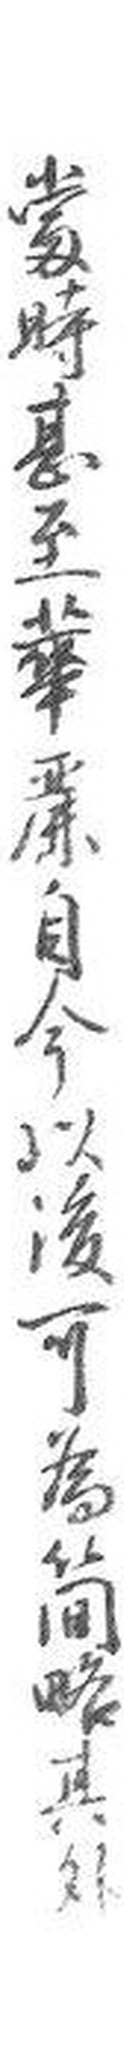当時甚至華麗自今以後可為簡略其外
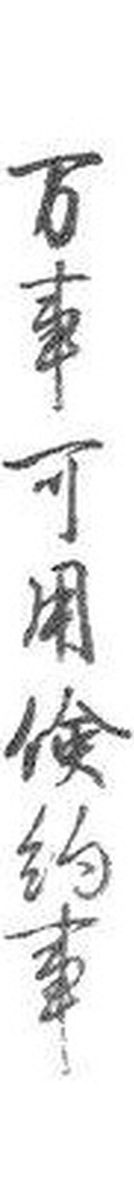万事可用倹約事
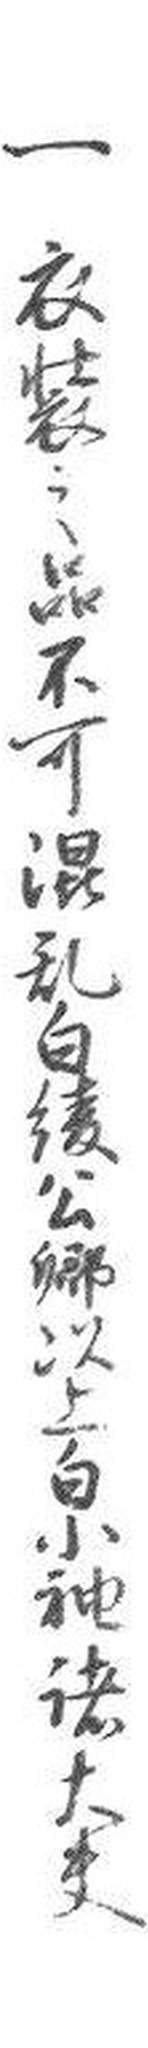一衣装之品不可混乱白綾公卿以上白小袖諸大夫
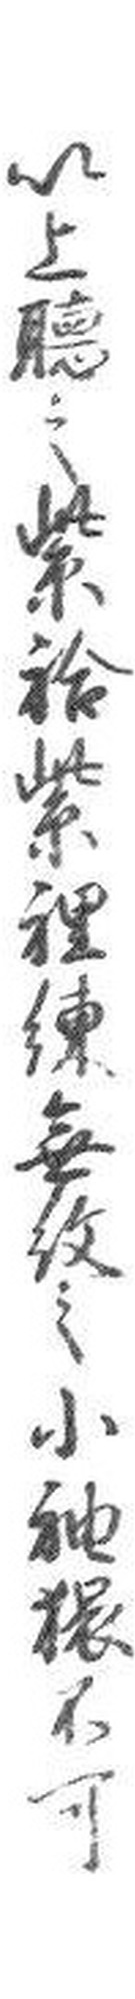以上聴之紫袷紫裡練無紋之小袖猥不可
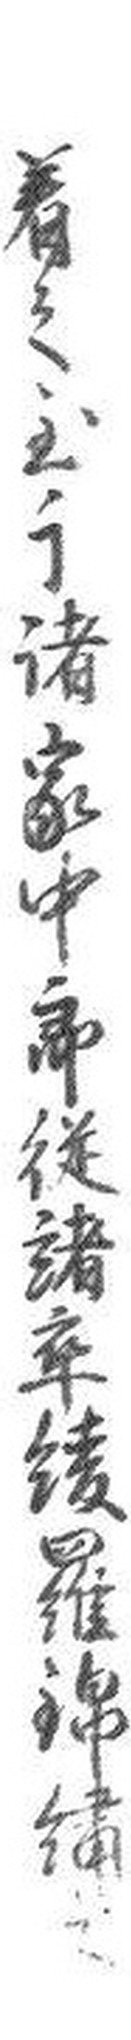着之至于諸家中郎従諸卒綾羅錦繡之
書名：家譜 四 忠昌公 従寛永七年到正保四年
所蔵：福井県文書館 Fukui Prefectural Archives
